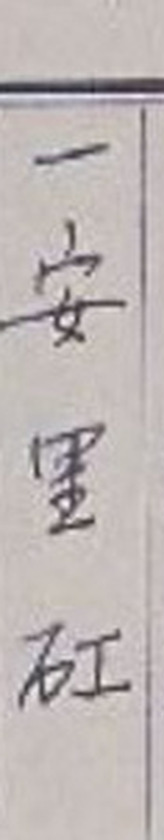一安里矼

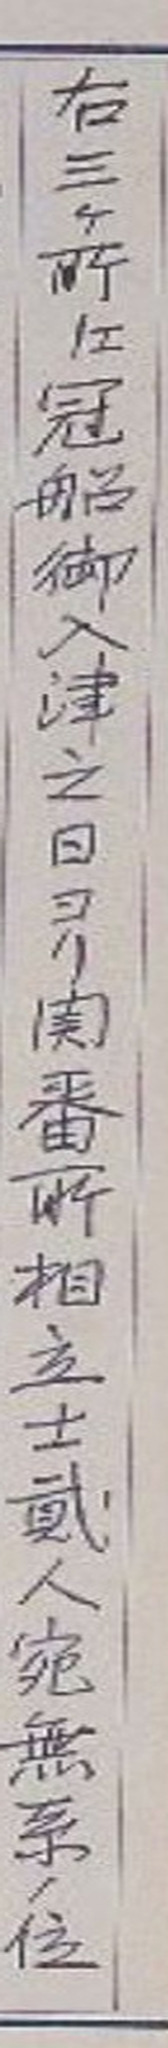右三ヶ所え冠船御入津之日より関番所相立士弐人宛無系の位
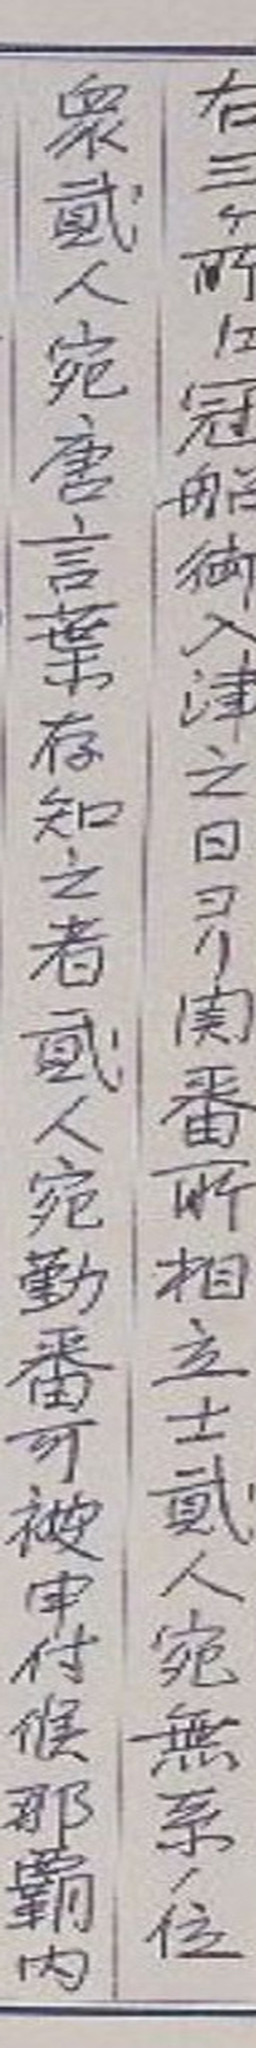衆弐人宛唐言葉存知之者弐人宛勤番可被申付候那覇内
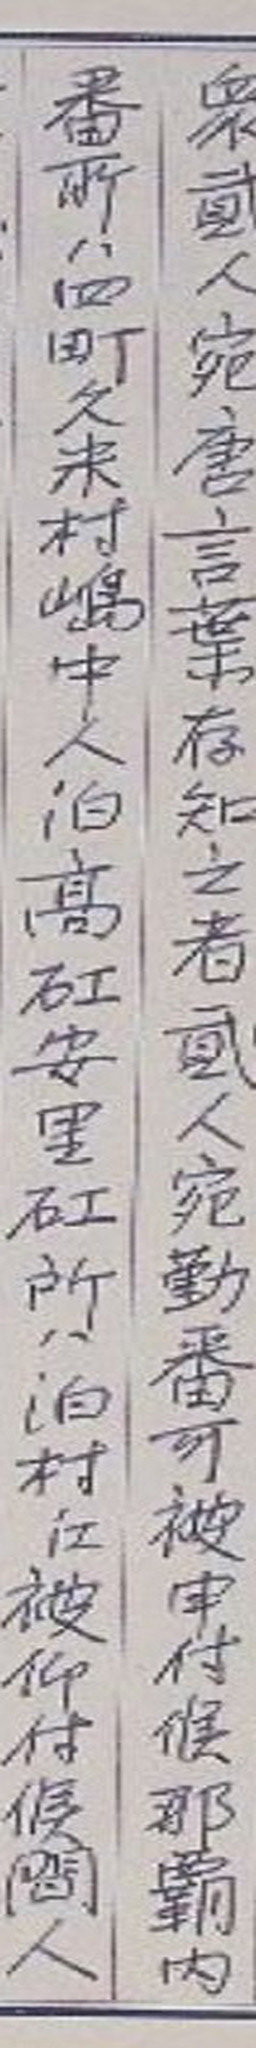番所は四町久米村島中人泊高矼安里矼所は泊村え被仰付候間人
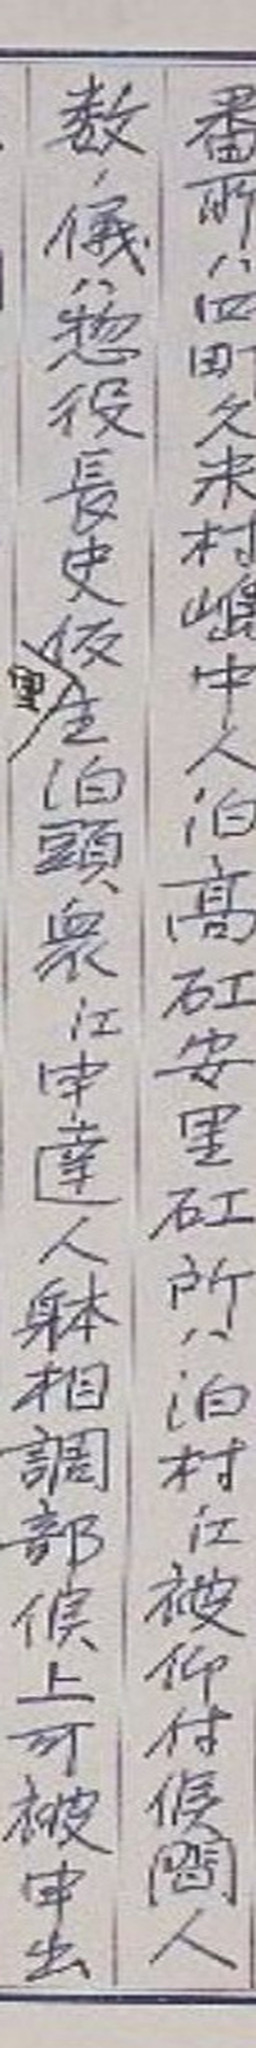数の儀は惣役長史仮里主泊頭衆え申達人躰相調部候上可被申出
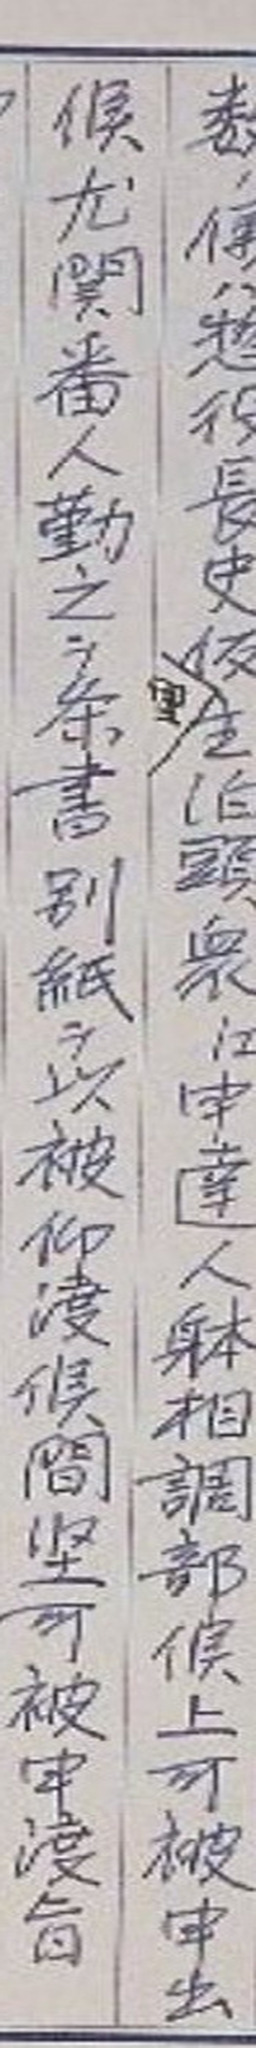候尤関番人勤之ケ条書別紙を以被仰渡候間堅可被申渡旨
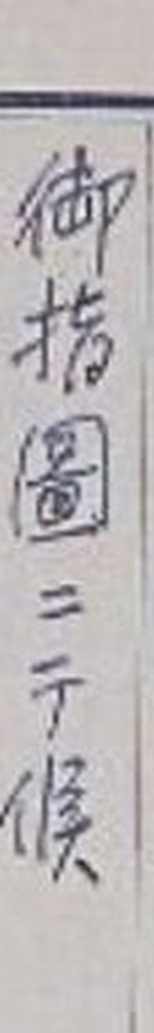御指図にて候
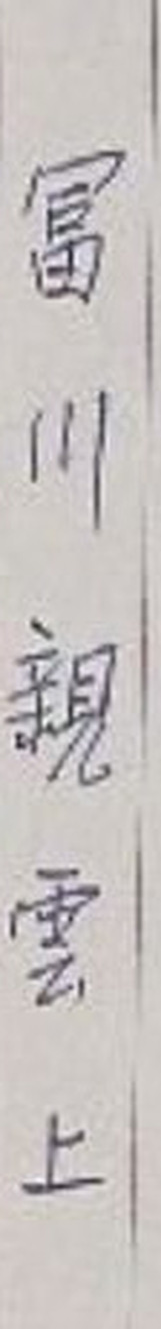冨島親雲上
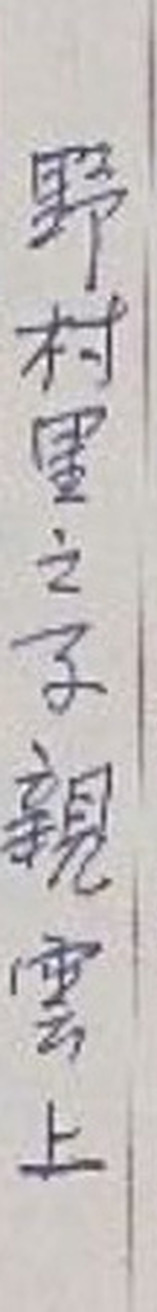野村里之子親雲上
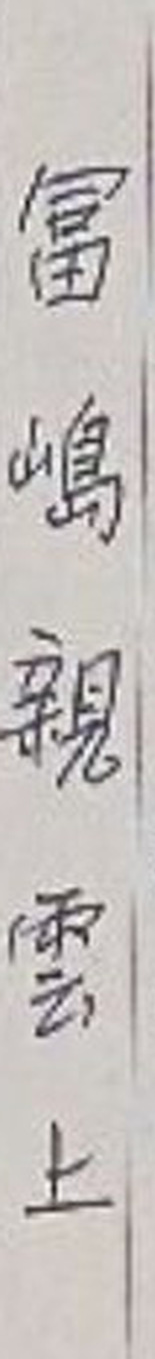冨島親雲上
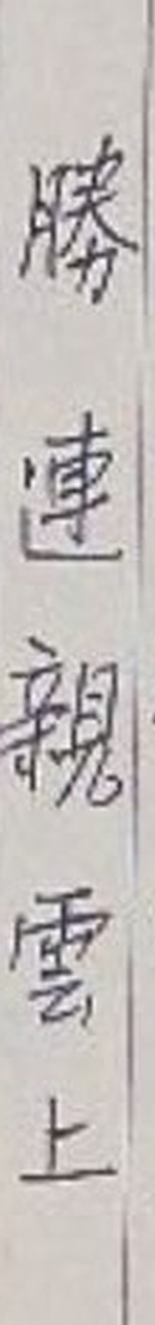勝連親雲上
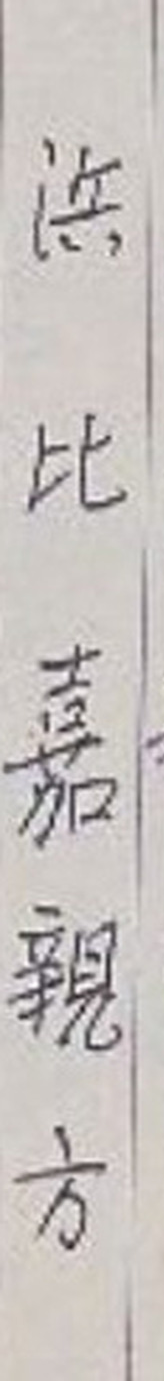浜比嘉親方
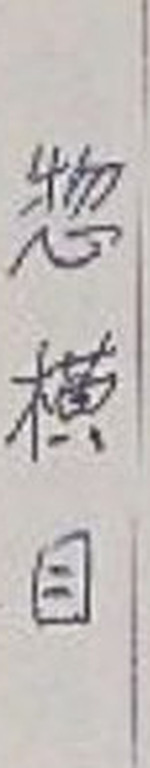惣横目
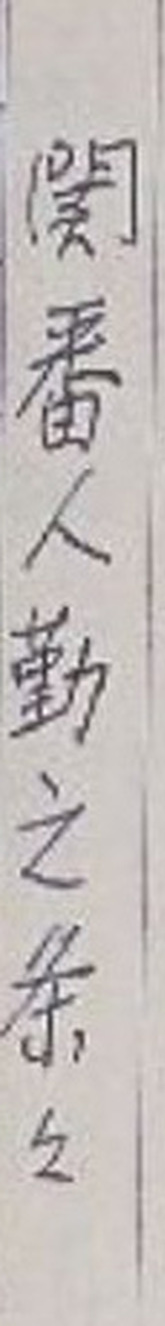関番人勤之条々
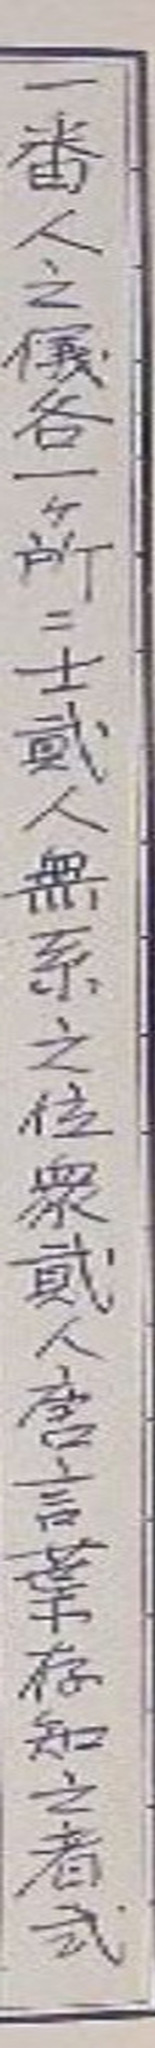一番人之儀各一ヶ所に士弐人無系之位衆弐人唐言葉存知之者弐
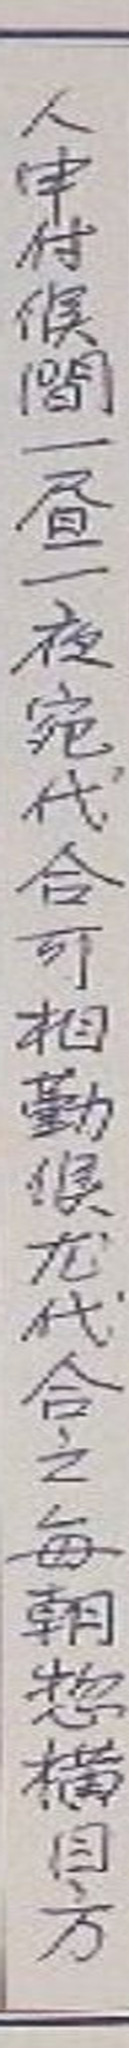人申付候間一昼一夜宛代合可相勤候尤代合之毎朝惣横目方
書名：支那冊封使来琉諸記 下巻
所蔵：University of the Ryukyus Library
